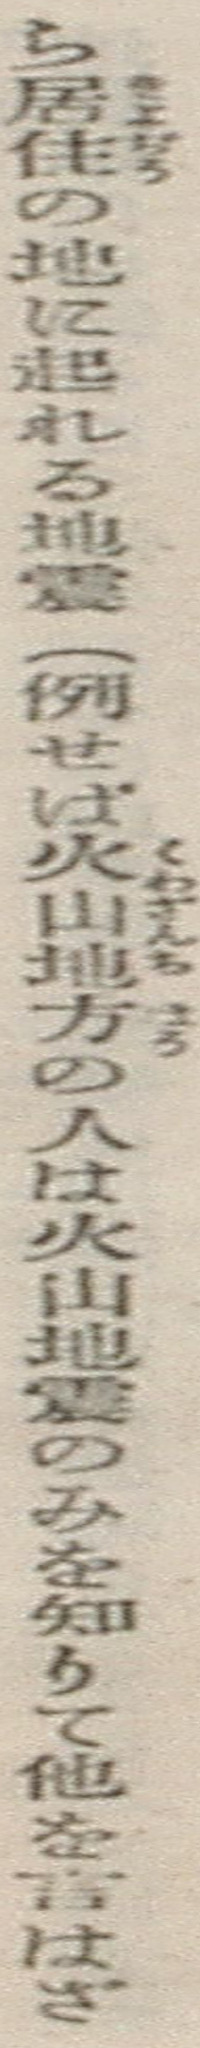ら居住の地に起れる地震の人は火山地震のみを知りて他を言はざ
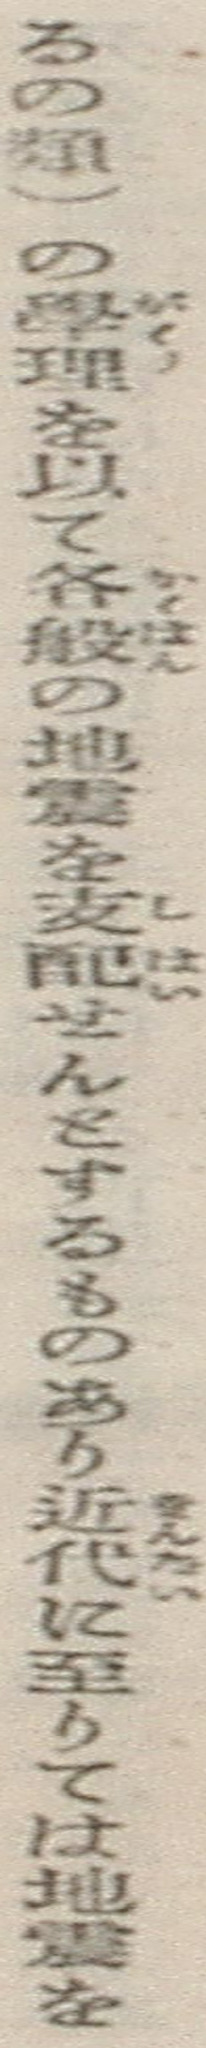るの類）の学理を以て各般の地震を支配せんとするものあり近代に至りては地震を
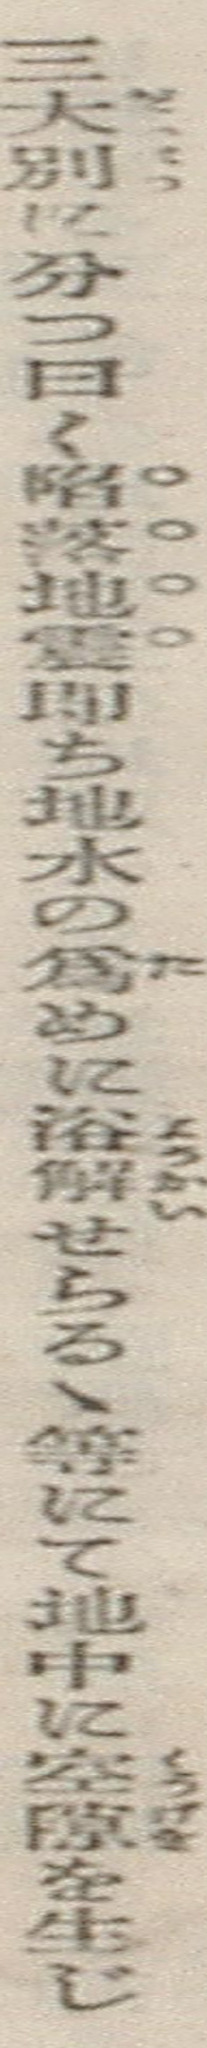三大別に分つ曰く陥落地震即ち地水の為めに浴解せらるゝ等にて地中に空隙を生じ
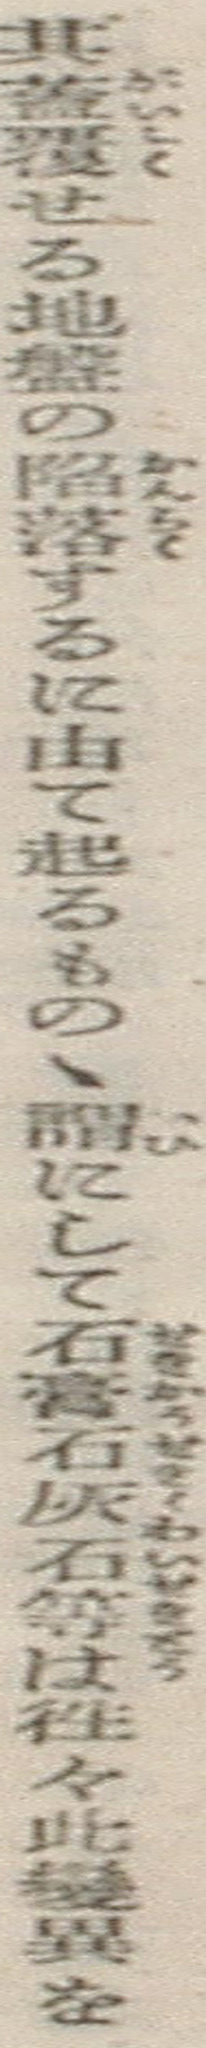其蓋覆せる地盤の陥落するに由て起るものゝ謂にして石膏石灰石等は往々此変異を
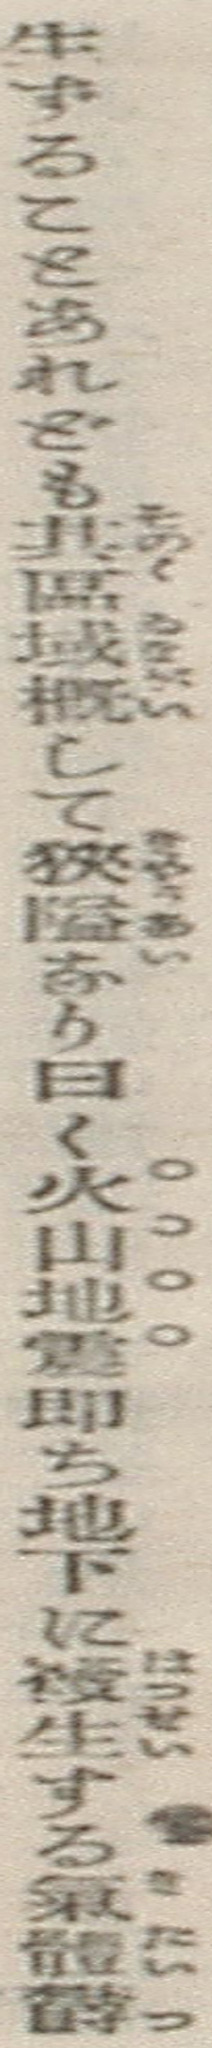生ずることあれども其区域概して狭隘なり曰く火山地震即ち地下に発生する気体鬱
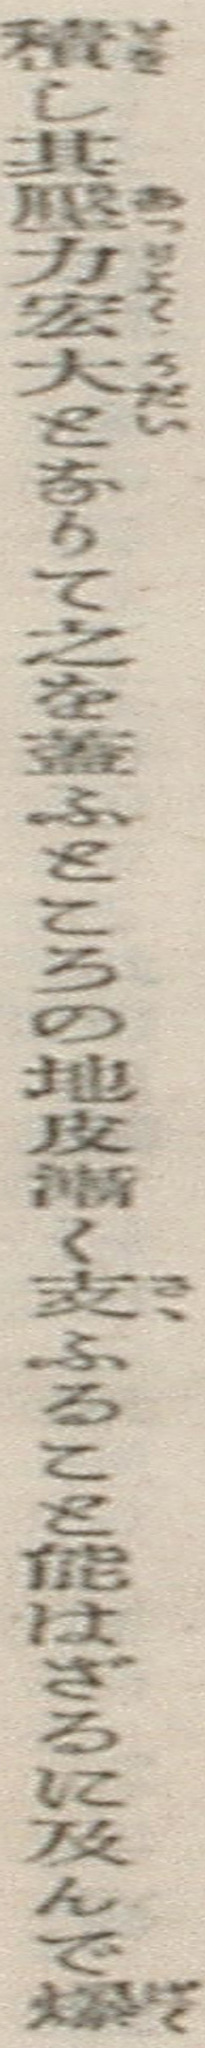積し其圧力宏大となりて之を蓋ふところの地皮漸く支ふることは能はざるに及んで爆
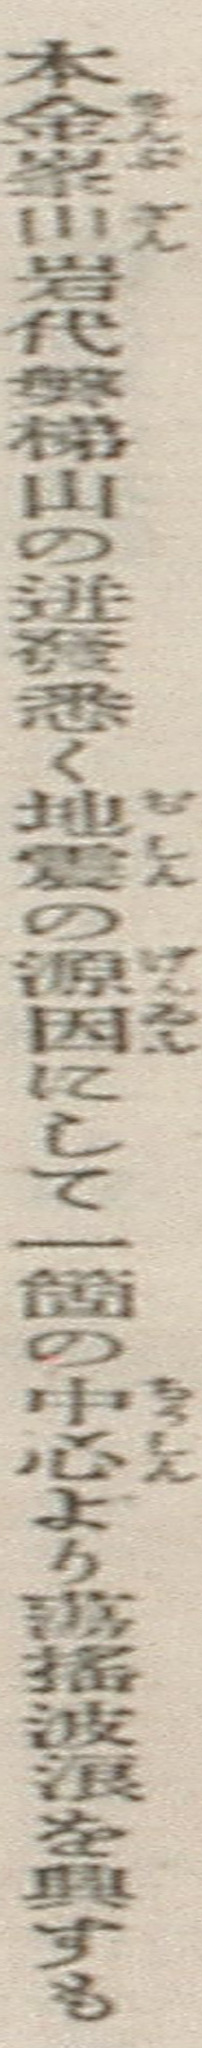本金峯山岩代磐梯山の併発悉く地震の源因にして一箇の中心より蕩揺波浪を興すも
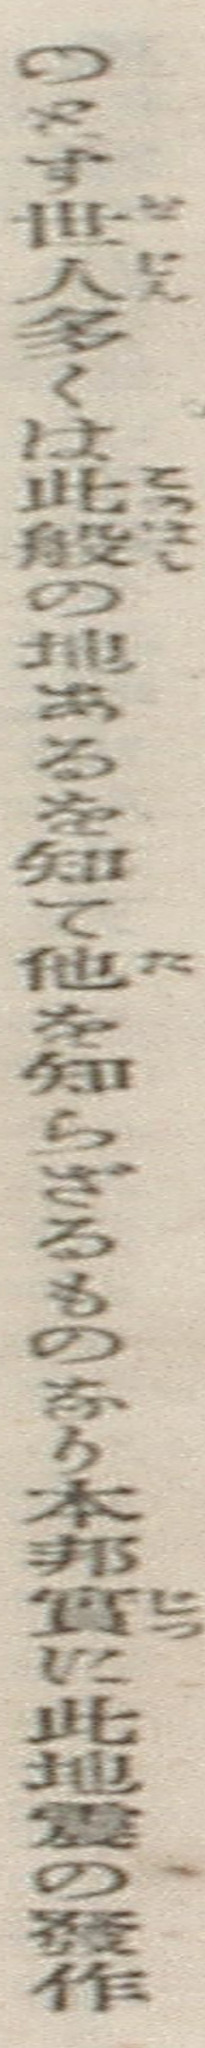のとす世人多くは此般の地あるを知て他を知らざるものなり本邦実に此地震の発作
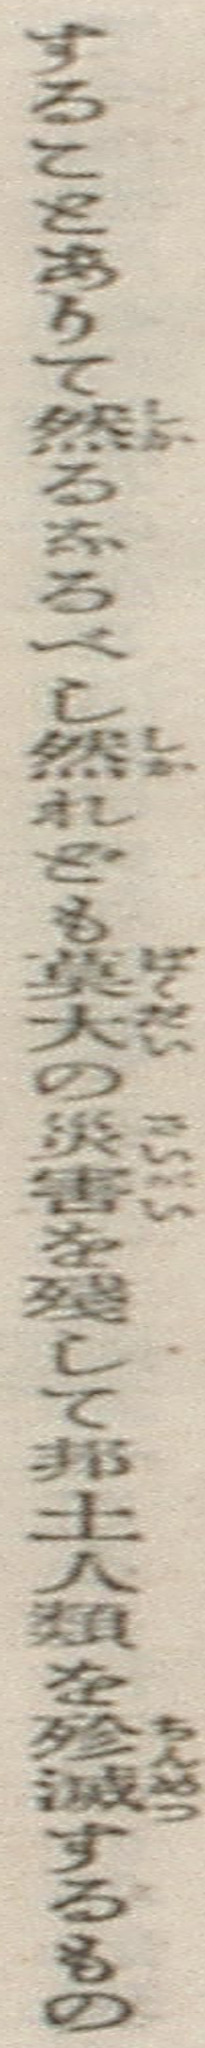することありて然るなるべし然れども莫大の災害を残して邦土人類を殄滅するもの

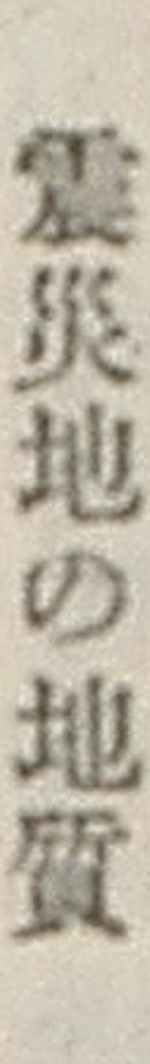震災地の地質
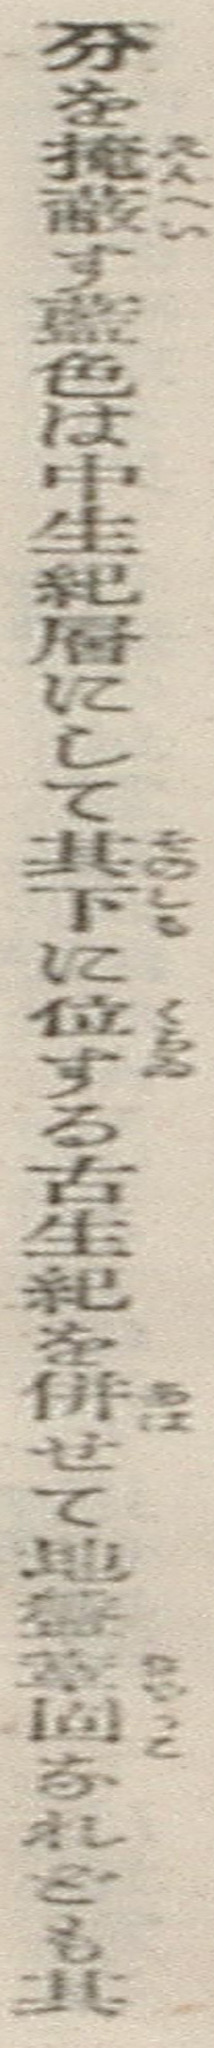分を掩蔽す藍色は中生紀層にして其下に位する古生紀を併せて地盤鞏固きやうこなれども其
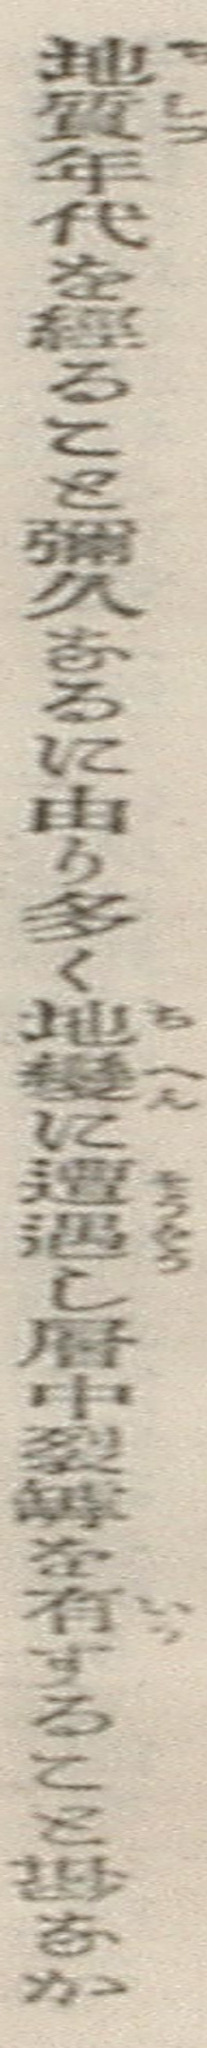地質ちしつ年代を経ること弥久なるに由り多く地変に遭遇し層中裂罅を有すること尠なか
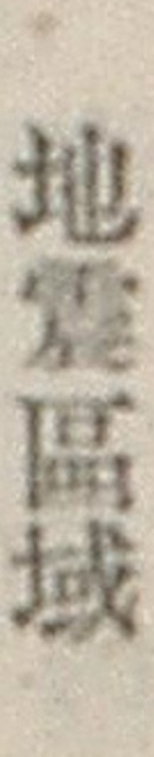地震区域
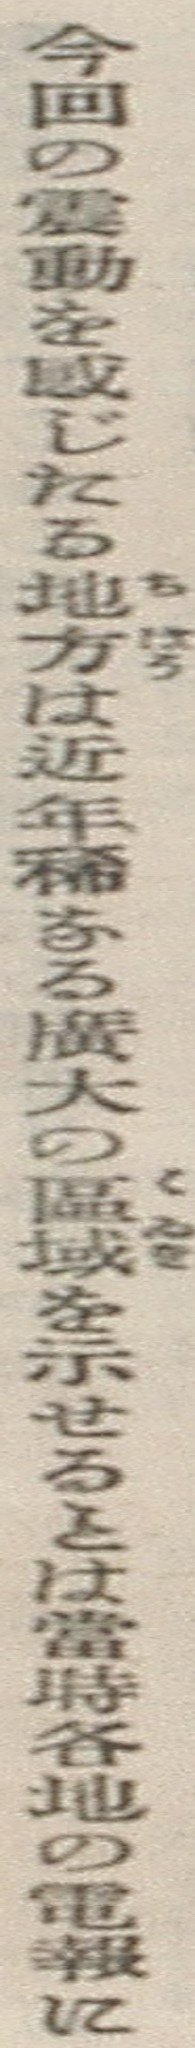今回の震動を感じたる地方は近年稀なる広大の区域を示せることは当時各地の電報に
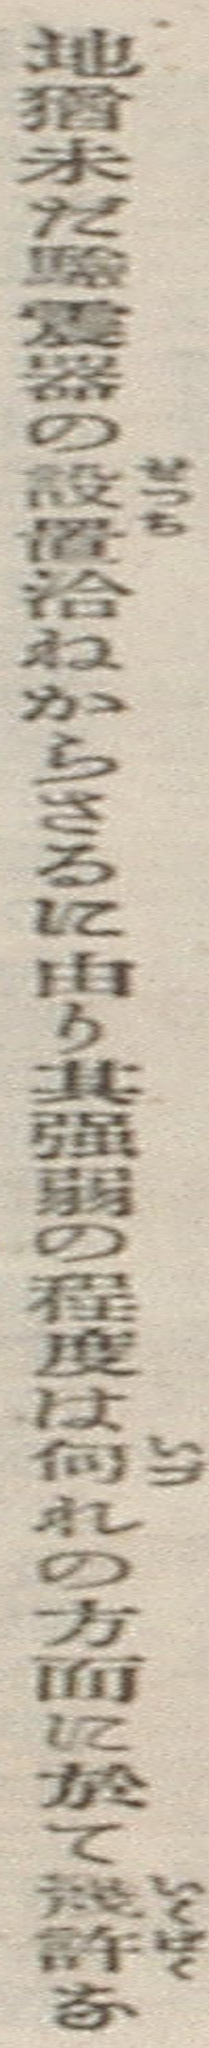地猶未だ験震器の設置せつち洽ねからさるに由り其強弱の程度は何れの方面に於て幾許な
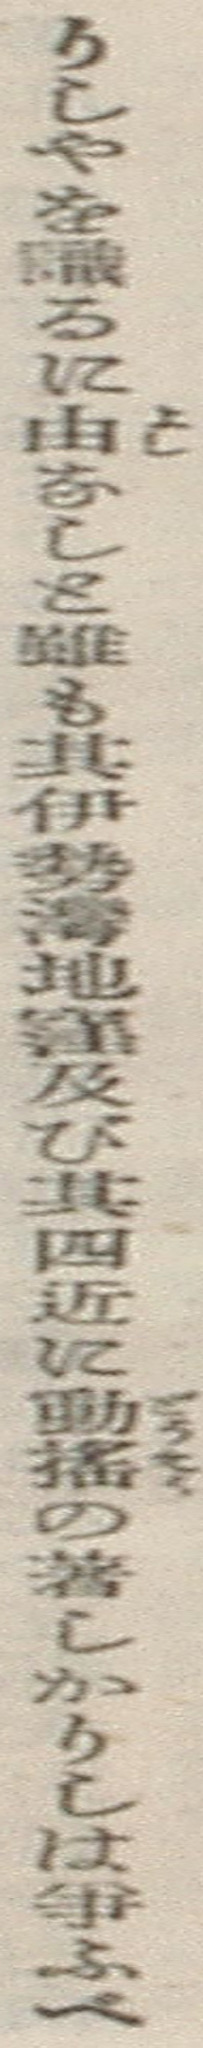りしやを識るに由なしと雖も其伊勢湾地窪及び其四近に動揺の著しかりしは争ふべ
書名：愛知岐阜福井三県　大地震見聞録（内題）
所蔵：東京大学地震研究所図書室 Earthquake Research Institute Library, The University of Tokyo, JAPAN
